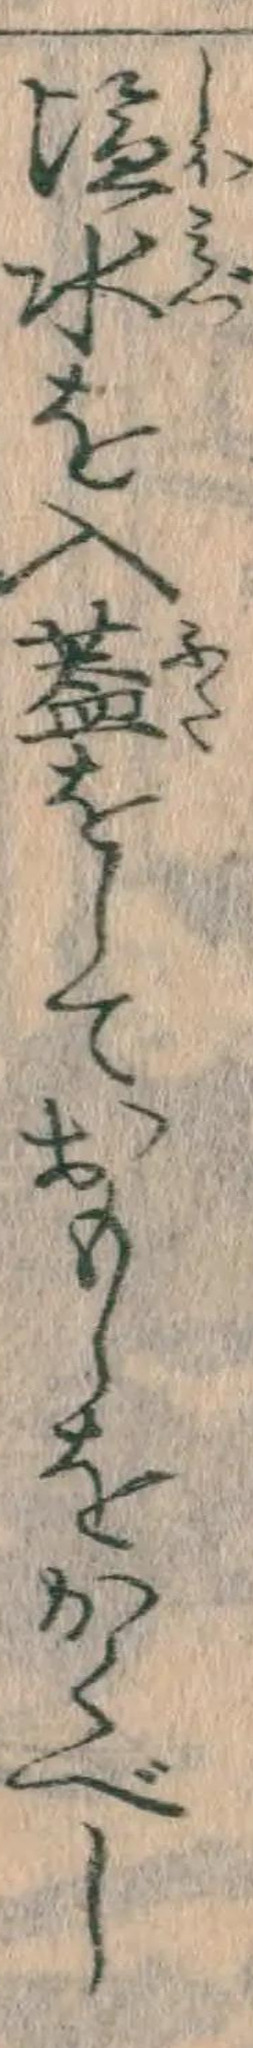塩水を入蓋をしておもしをかくべし
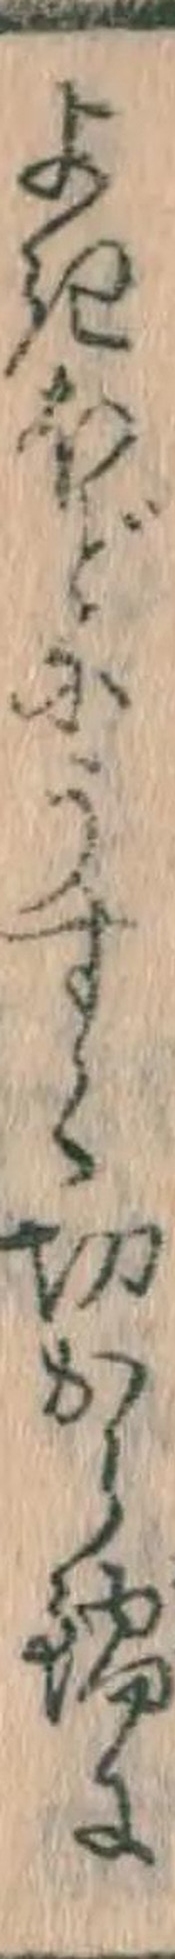よきほどにうすく切から鍋に
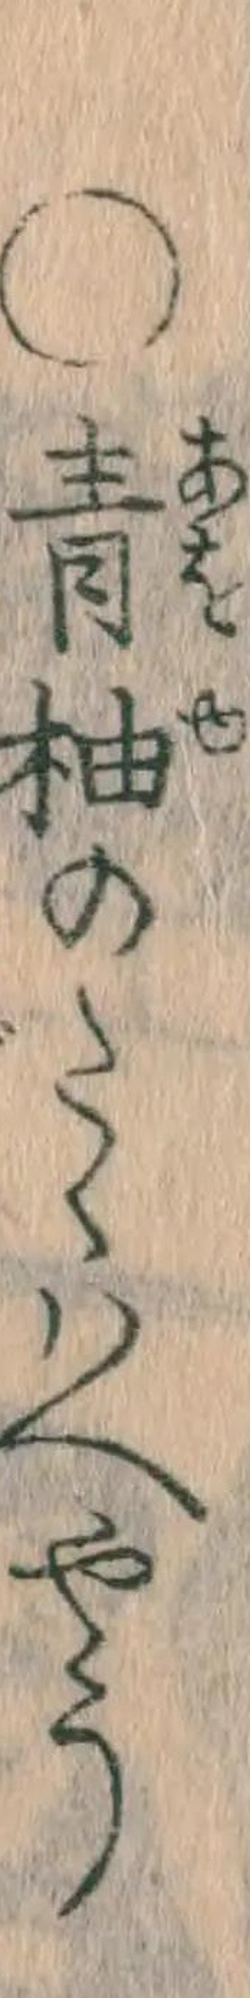○青柚のたくはへやう
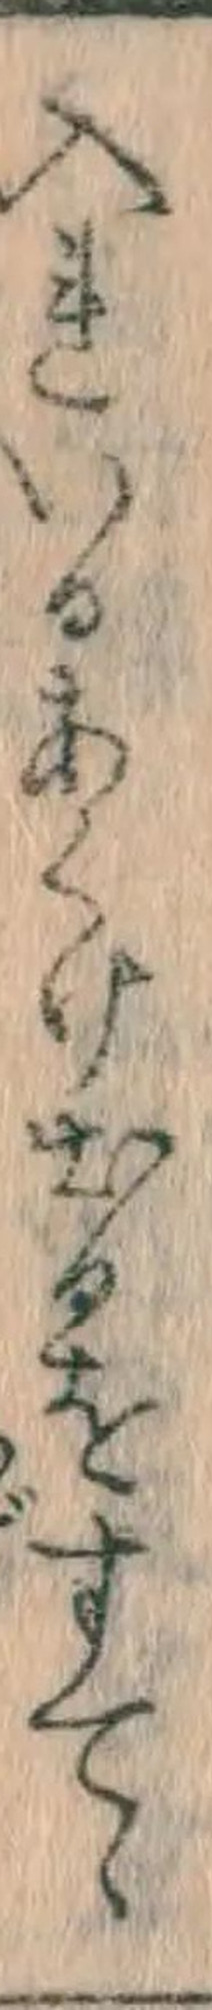入れいるあくけ出るをすてゝ
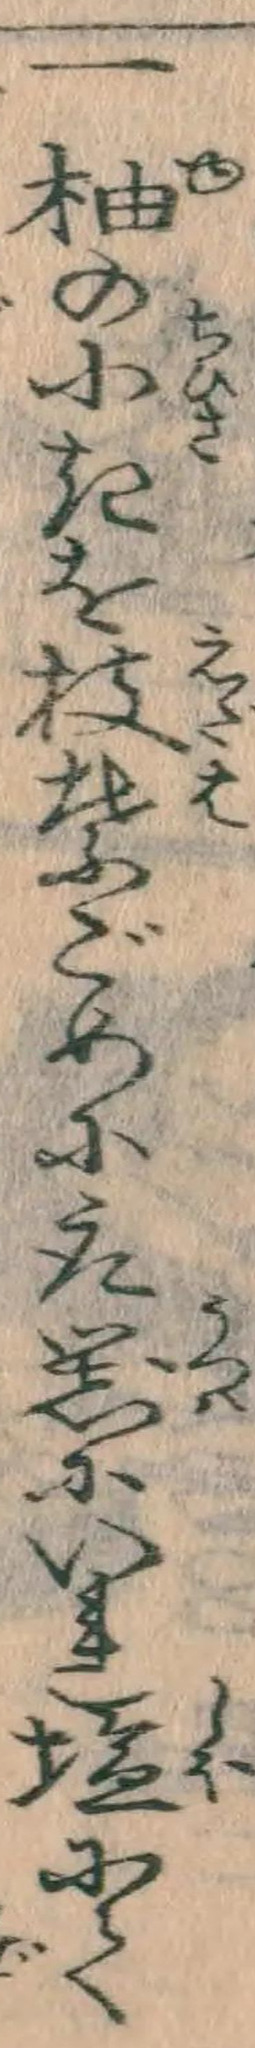一柚の小きを枝葉ごめに取器にいれ塩にて
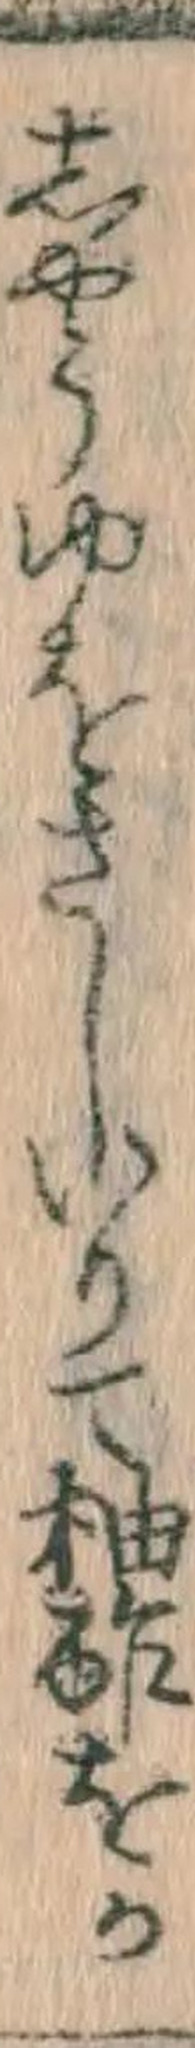しやうゆをさしいりて柚酢をか
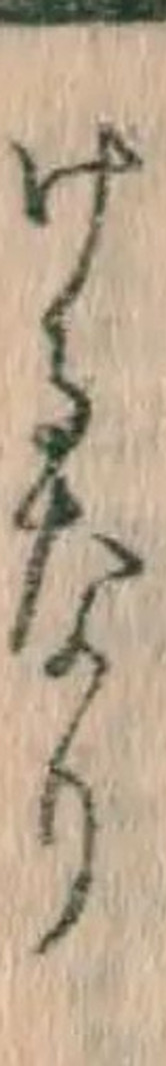けるなり
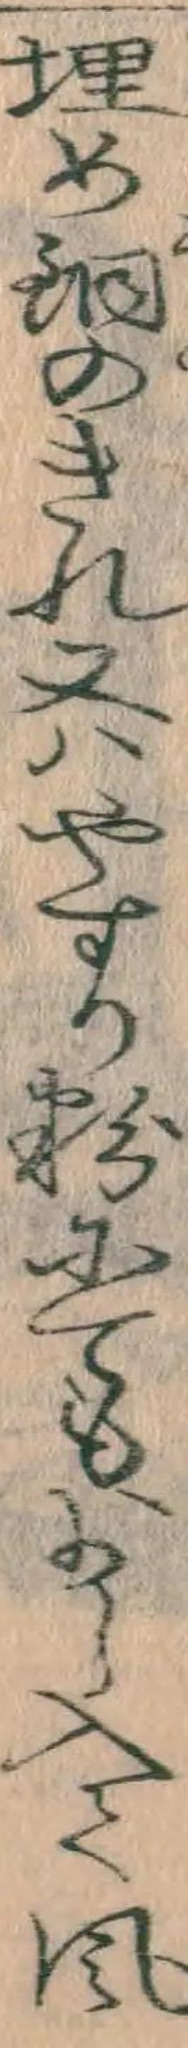埋め銅のきれ又はやすり粉にても少し入て風
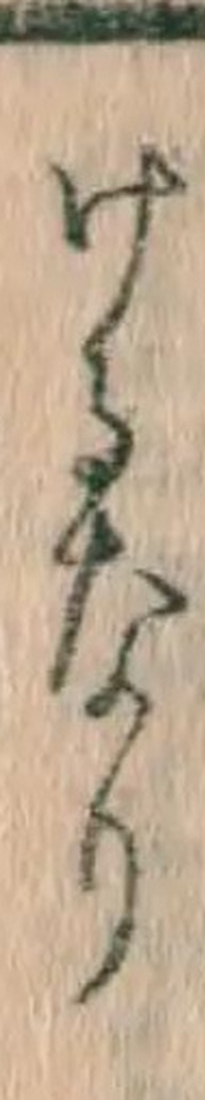けるなり
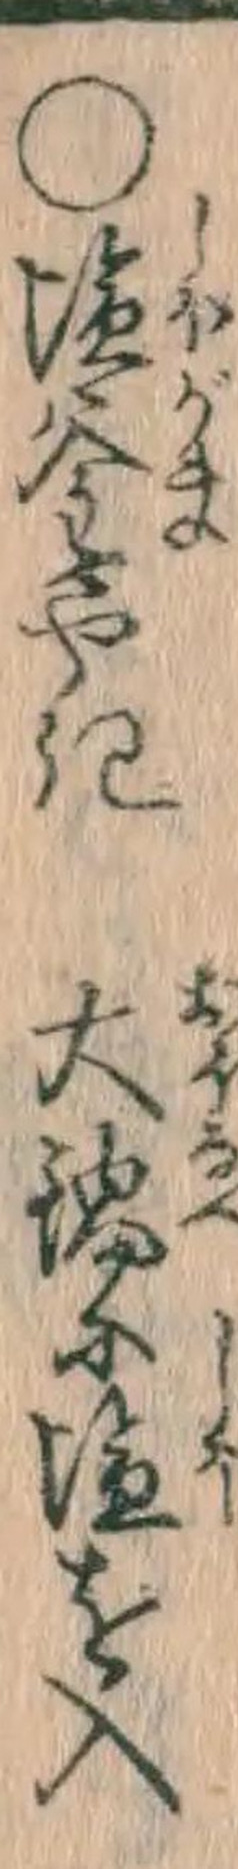○塩釜やき大鍋に塩を入
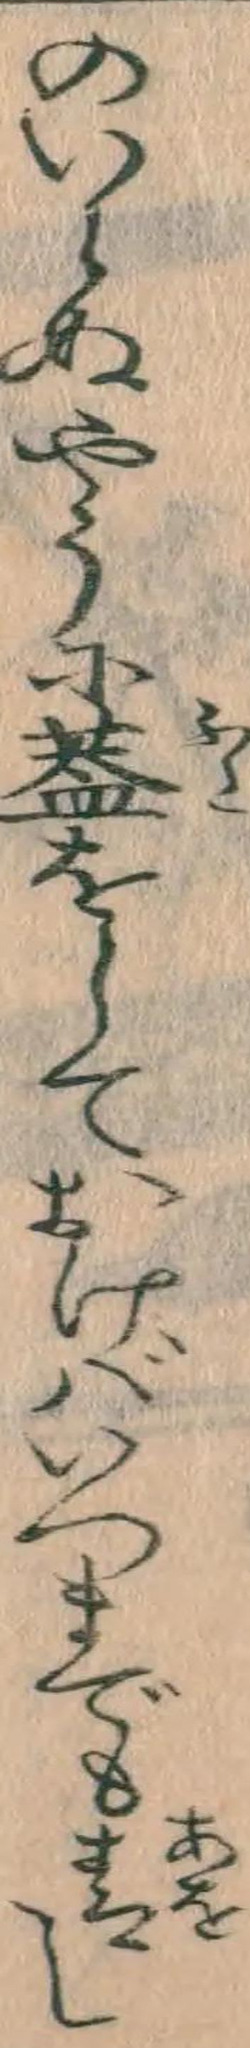のいらぬやうに蓋をしておけばいつまでも青し
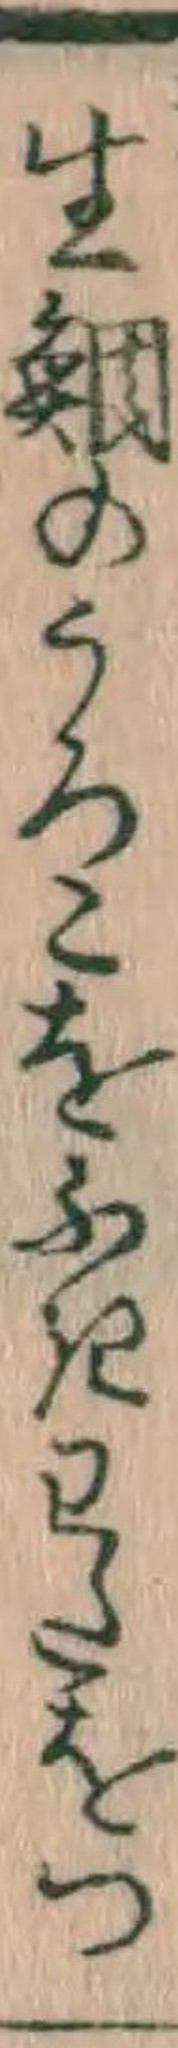生鯛のうろこをふきわたをつ
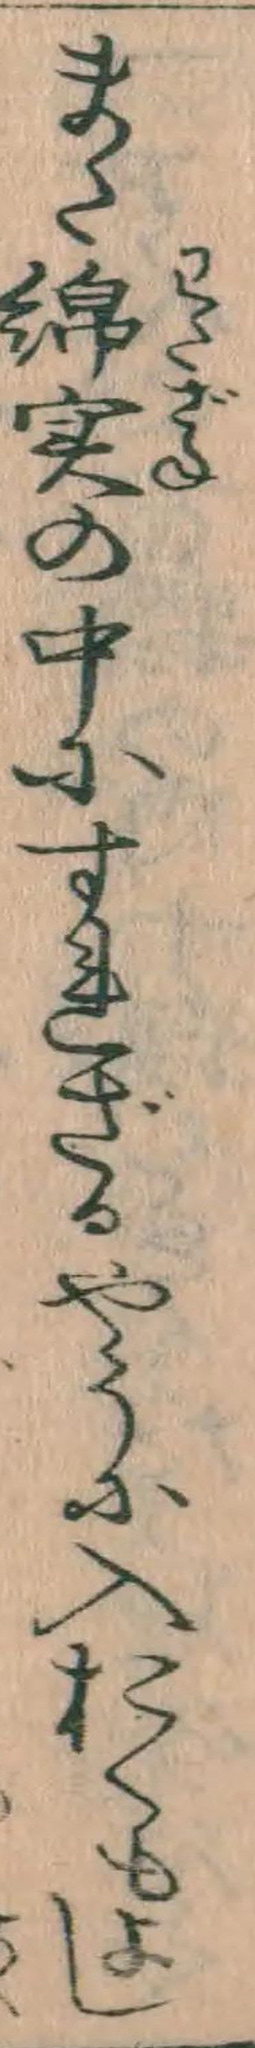また綿実の中にすれざるやうに入おくもよし
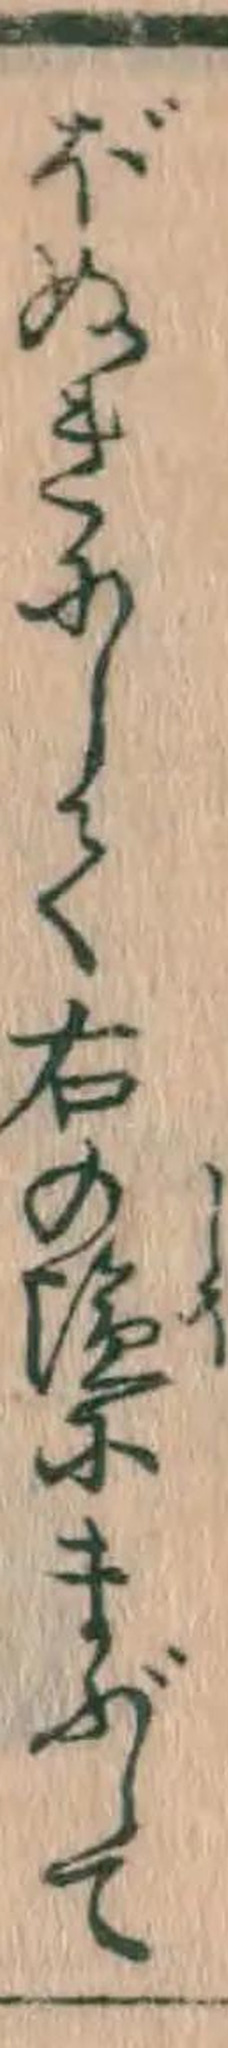ぼぬきにして右の塩にまぶして
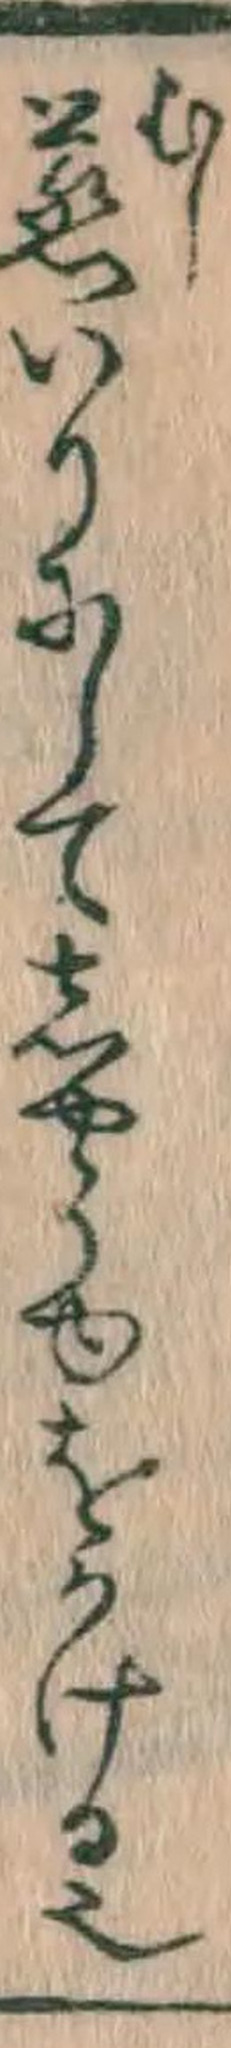蒸いりにしてしやうゆをかける也
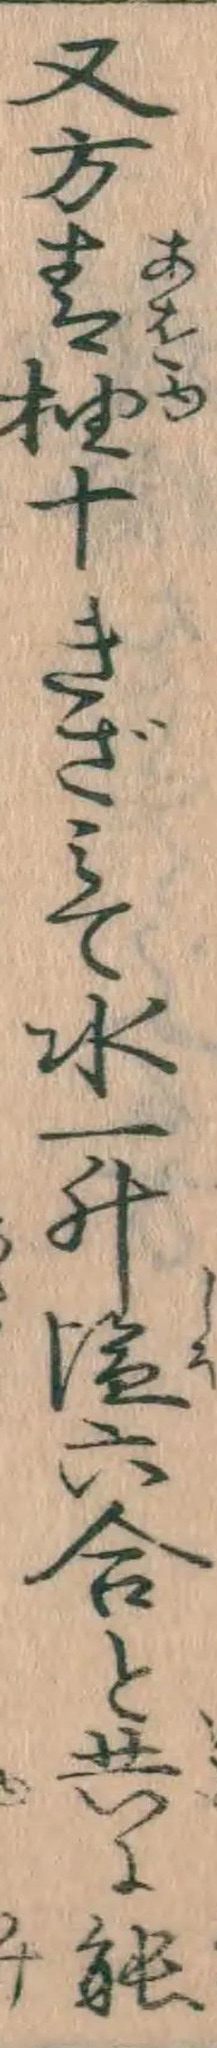又方青柚十きざみて水一升塩六合と共に能
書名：広益秘事大全 3巻. [5]
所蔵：国立国会図書館 National Diet Library, JAPAN
